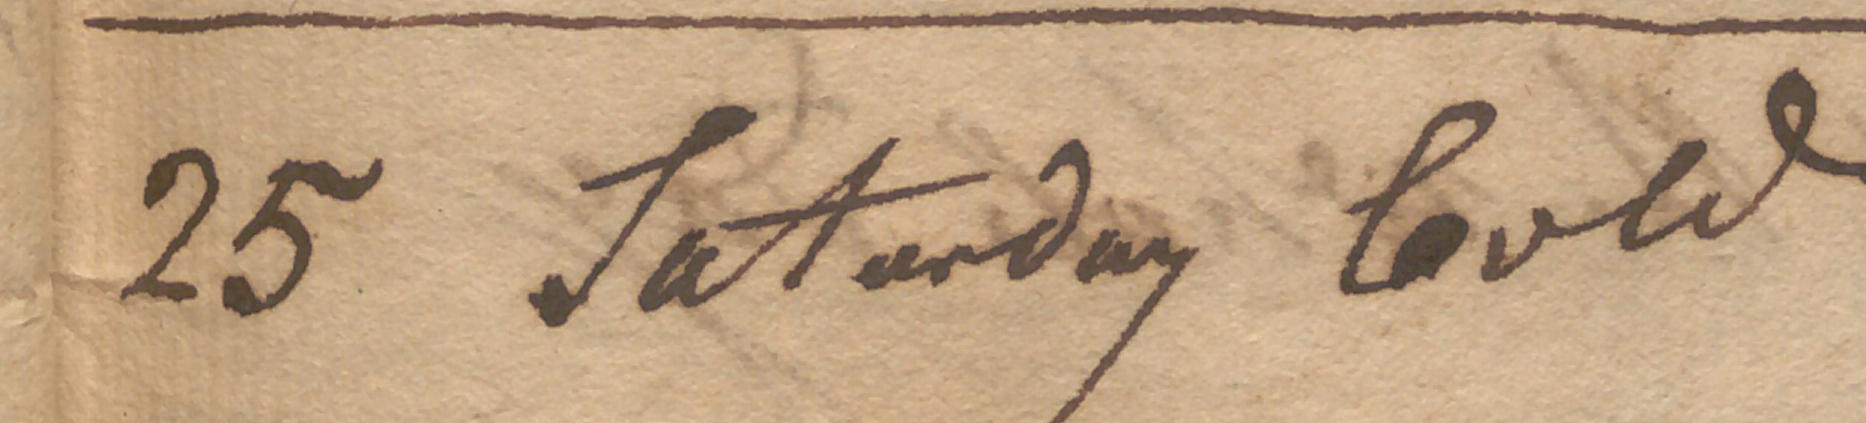25 Satarday Cold
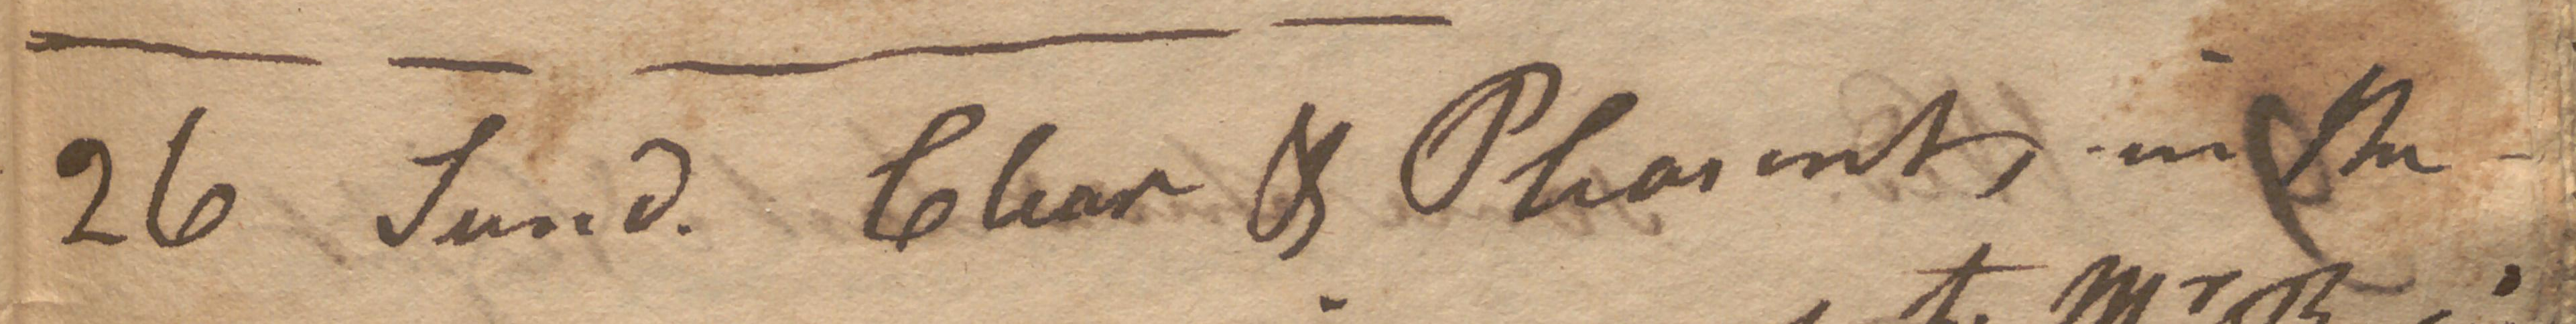26 Sund. Clear & Pleasent, in the
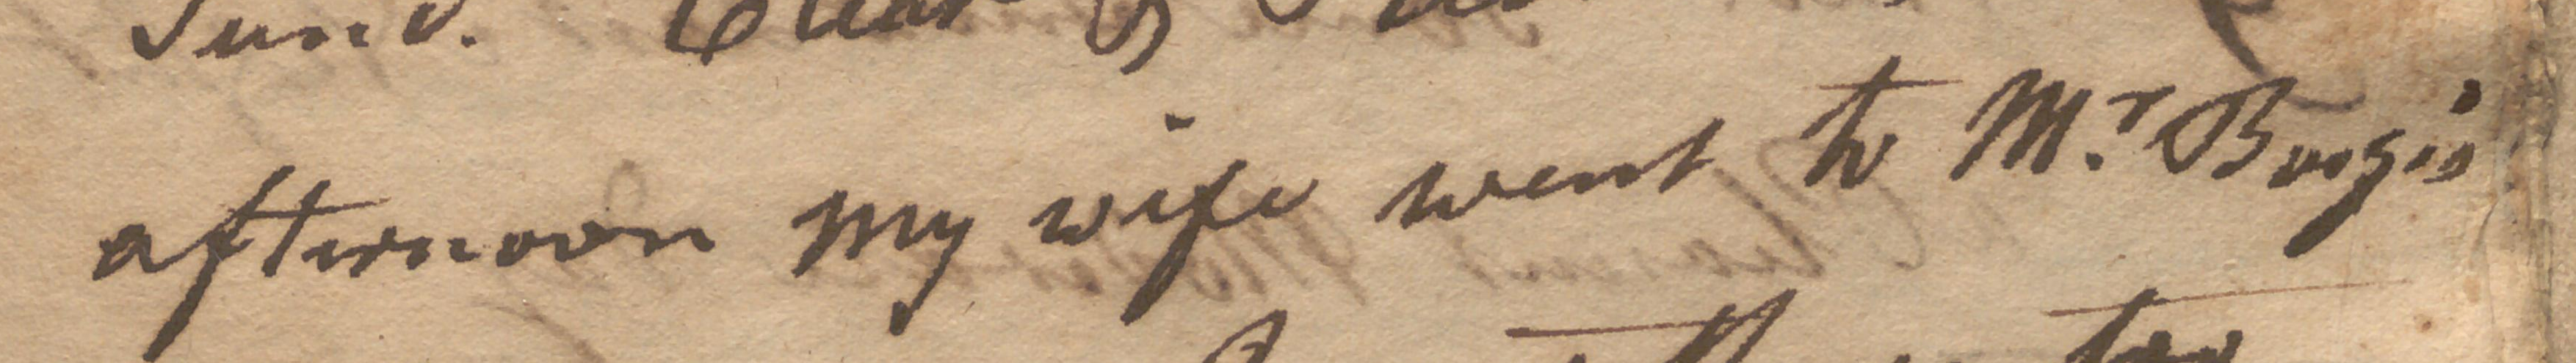afternoon my wife went to M^r. Barge's
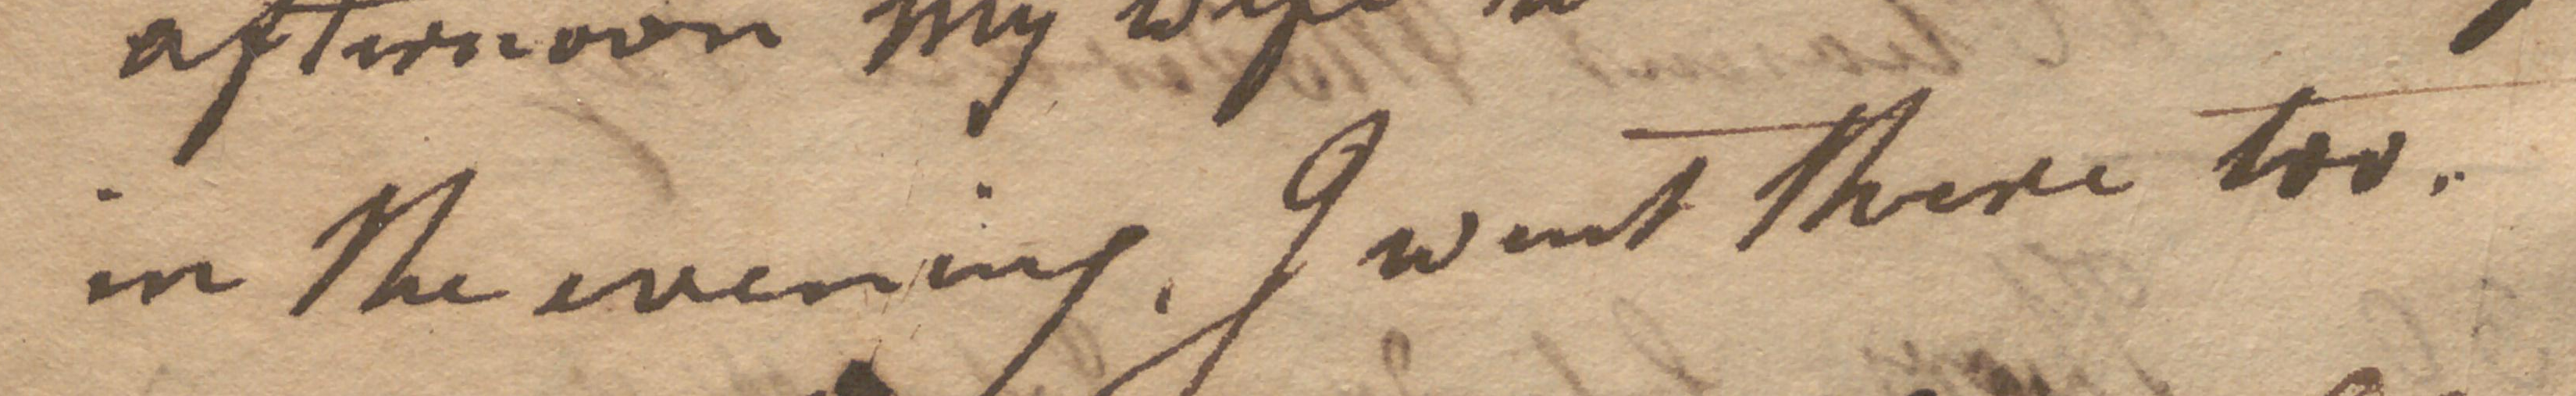in the evening, I went there too.
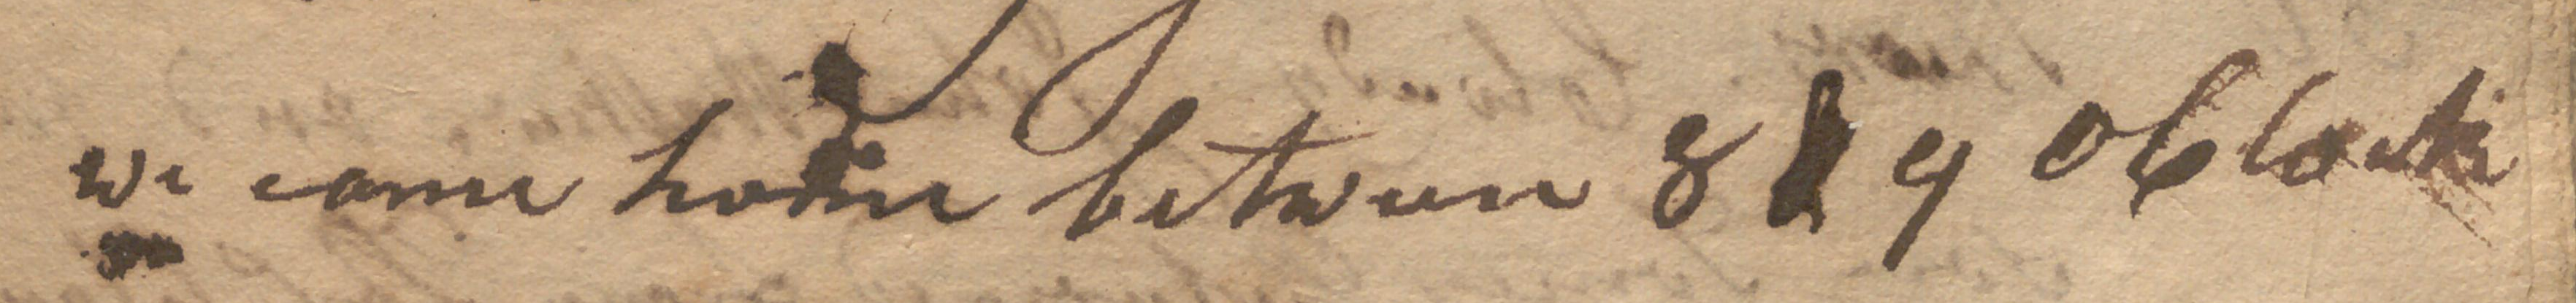we came home betwen 8 & 9 oClock
